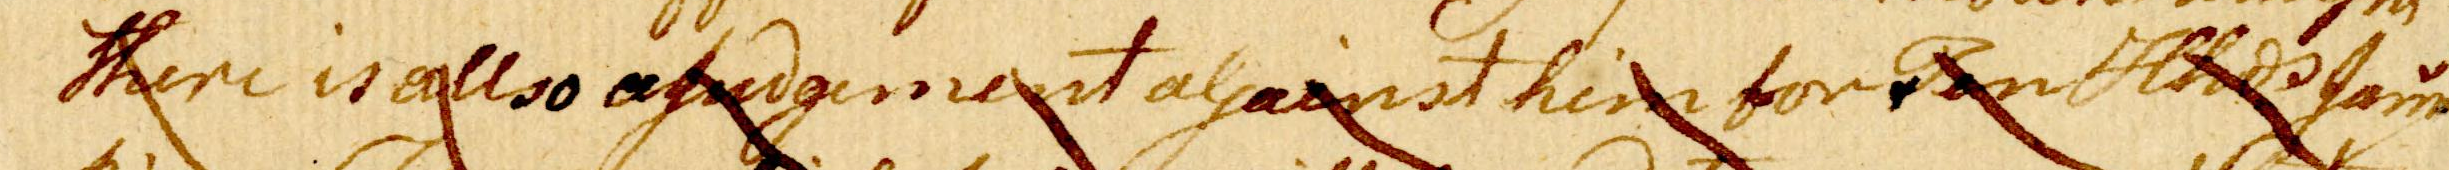There is also a judgement against him for Ton Hhds Jam^s
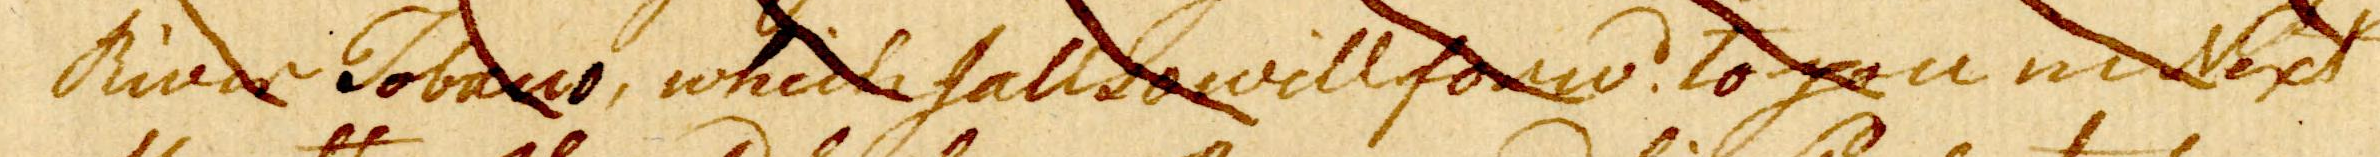River Tobacmco, which I allso will forw^d. to you in next
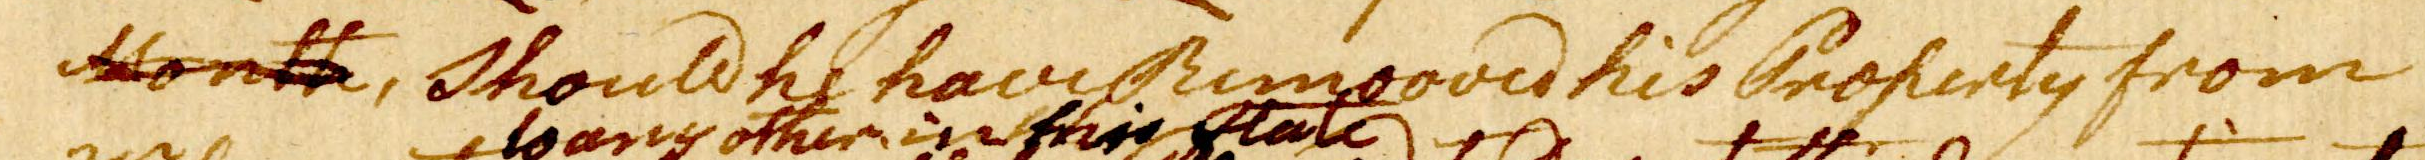[Month], should he have Remooved his Property from
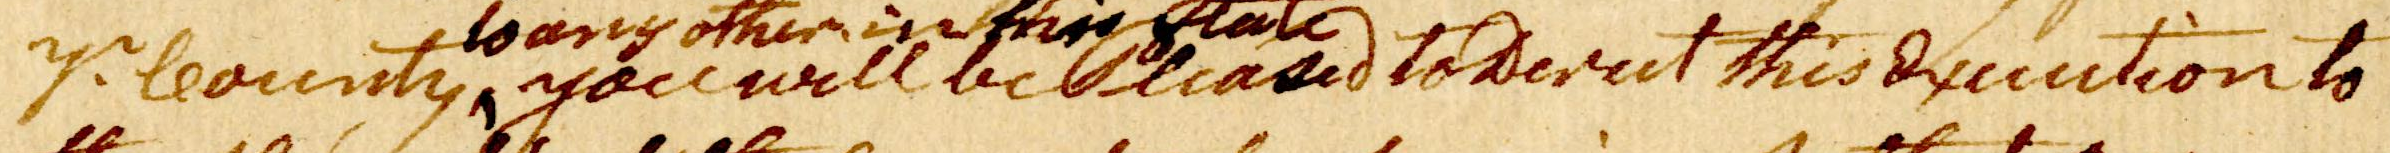y^r County, you well be pleased to Derect this Execution to
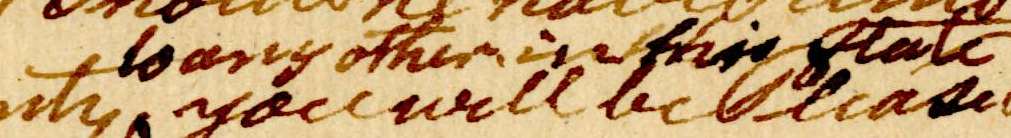to any other in this state
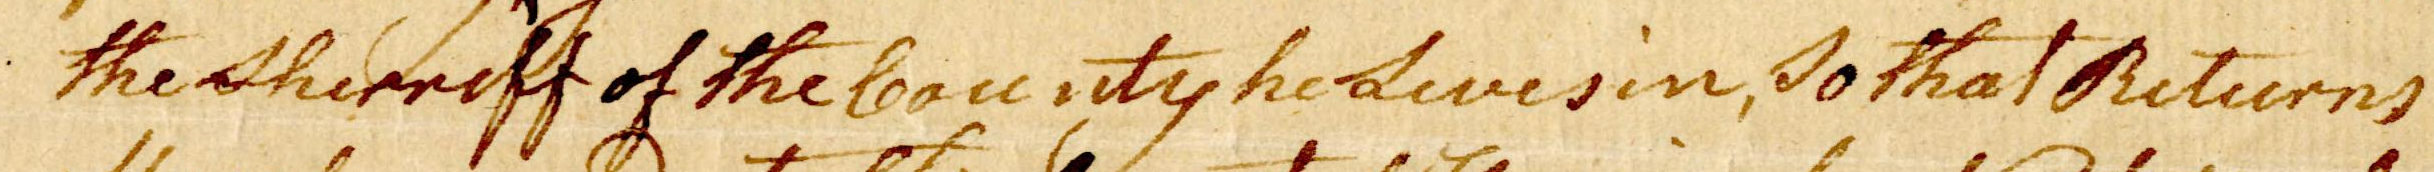the sherriff of the County he Lives in, so that Returns,
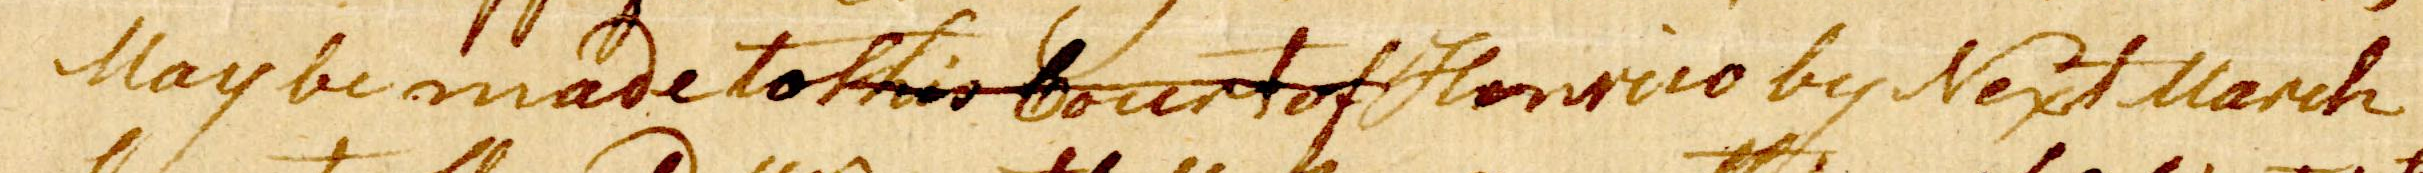May be made to [this Court of] Henries by Next March
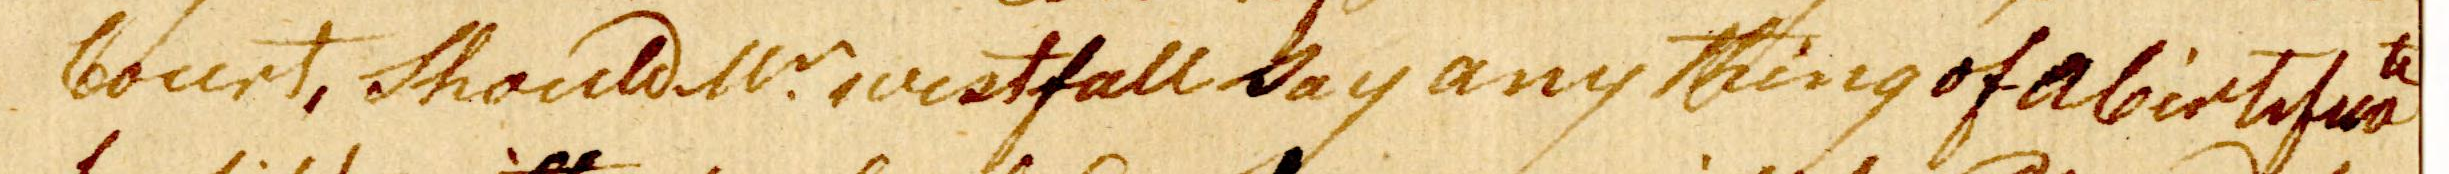Court, should M^r. Westfall say any thing of a cirtefica^te
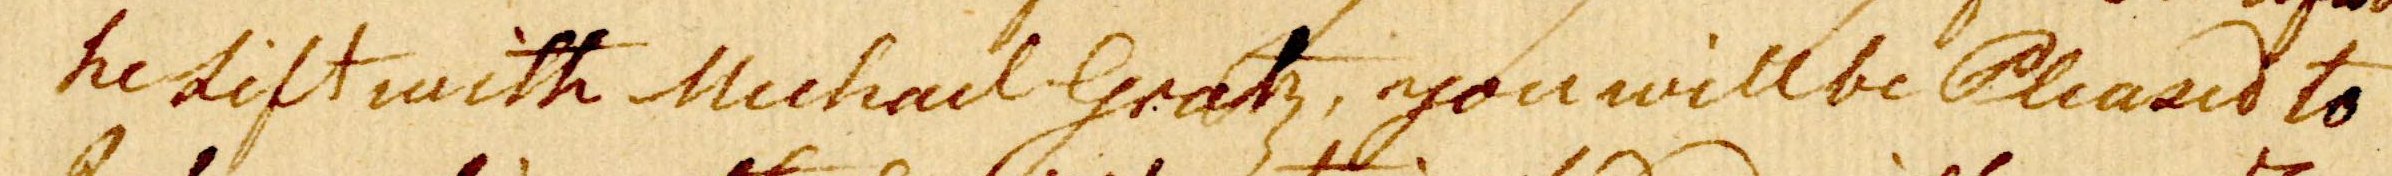he Left with Michael Gratz, you will be Pleased to
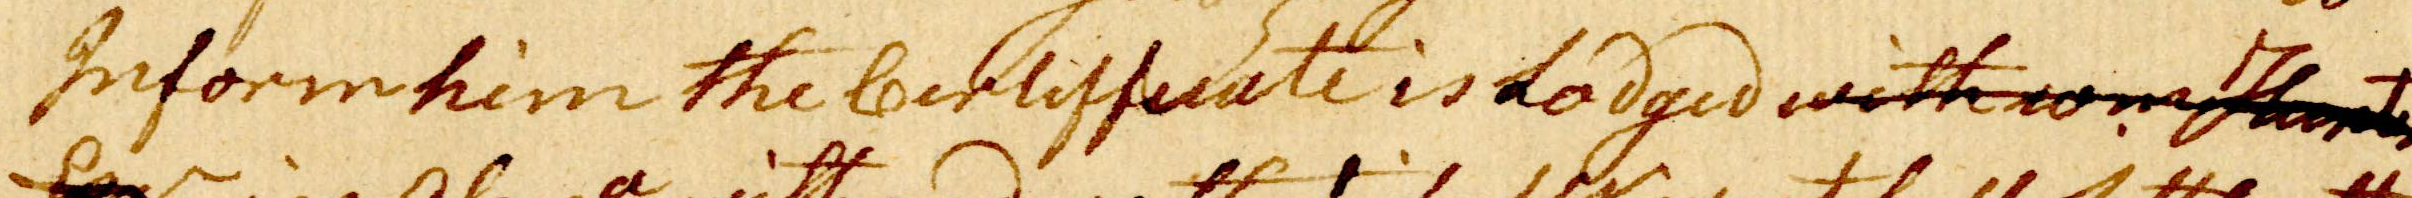Inform him the Certificate is Lodged [with] [_________]
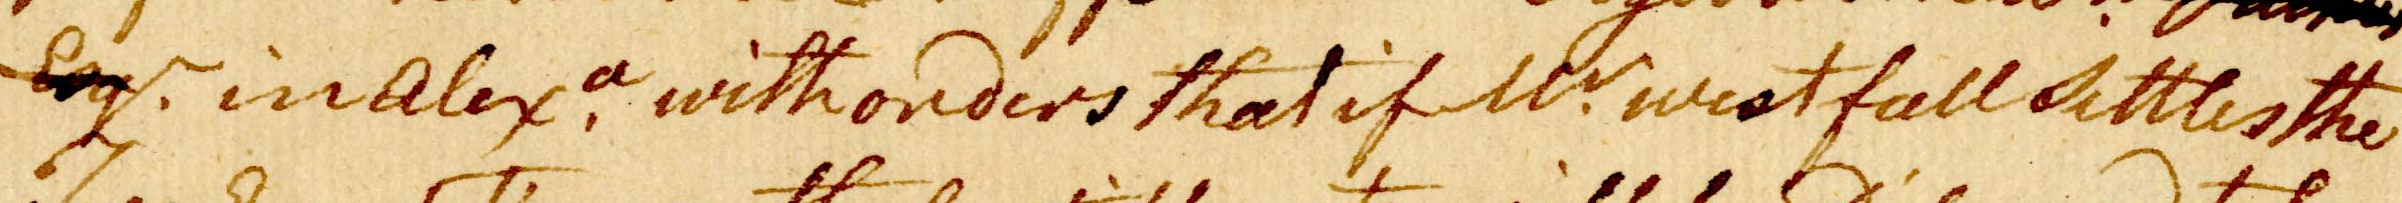[Esq^r.] in Alex^a With orders that if M^r. Westfull settles the
